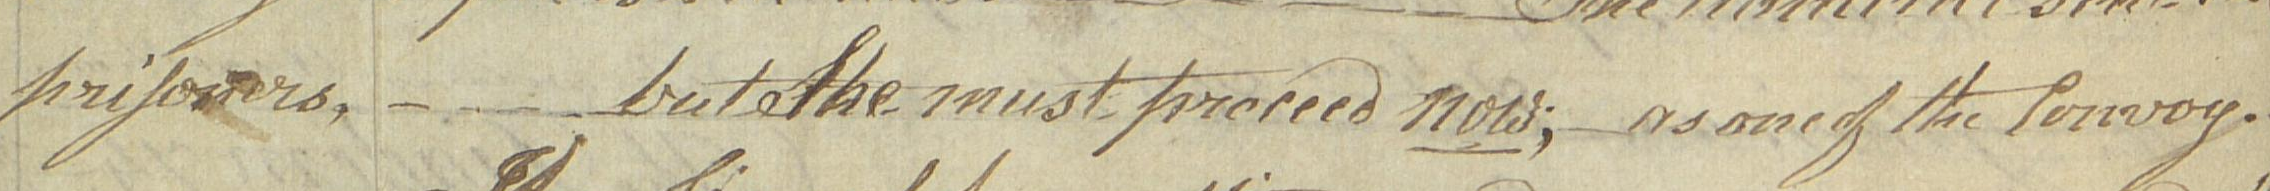prisoners, but she must proceed now; as one of the Convoy
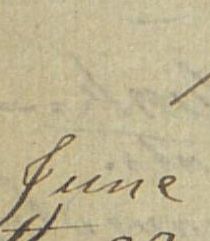June
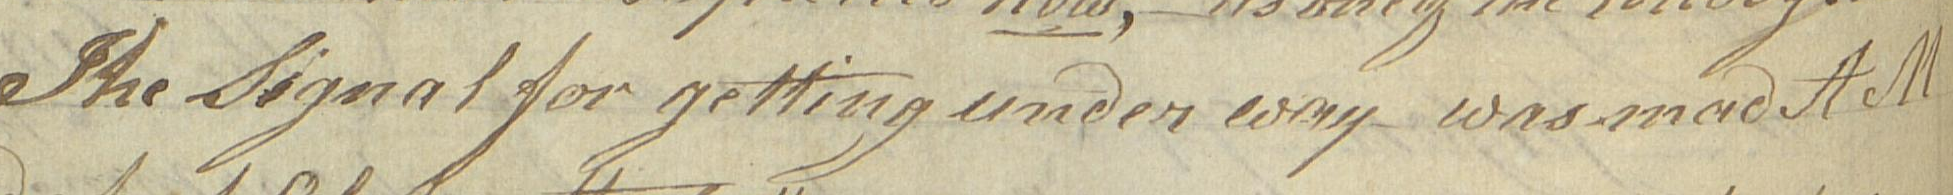The Signal for getting under way was mad AM
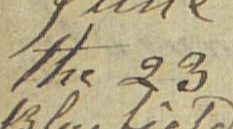the 23
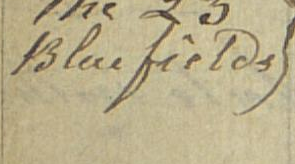Blue fields
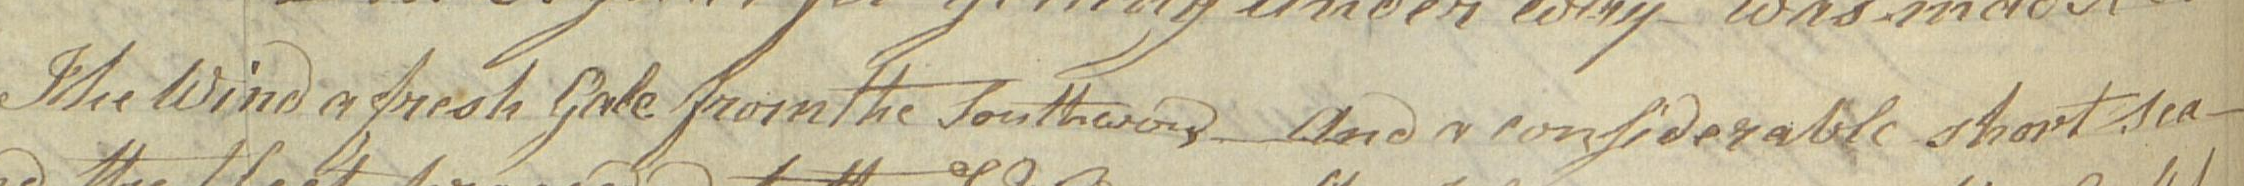The Wind a fresh Gale from the Southward, And a considerable short sea
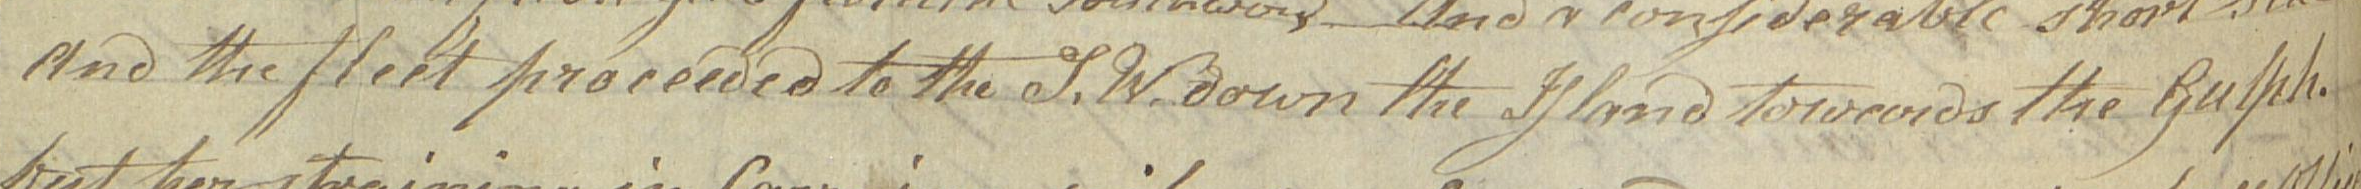and the fleet proceeded to the S.W. down the Island towards the Gulph.
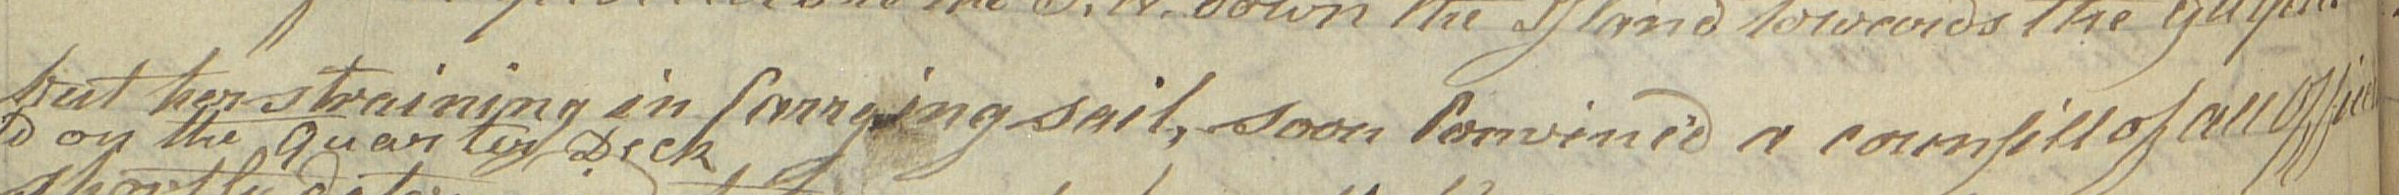but her straining in Carrying sail, soon Convenc'd a counsill of All Offic-
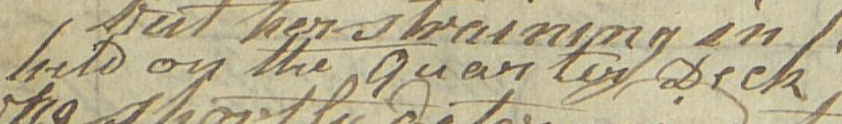held on the quarter Deck
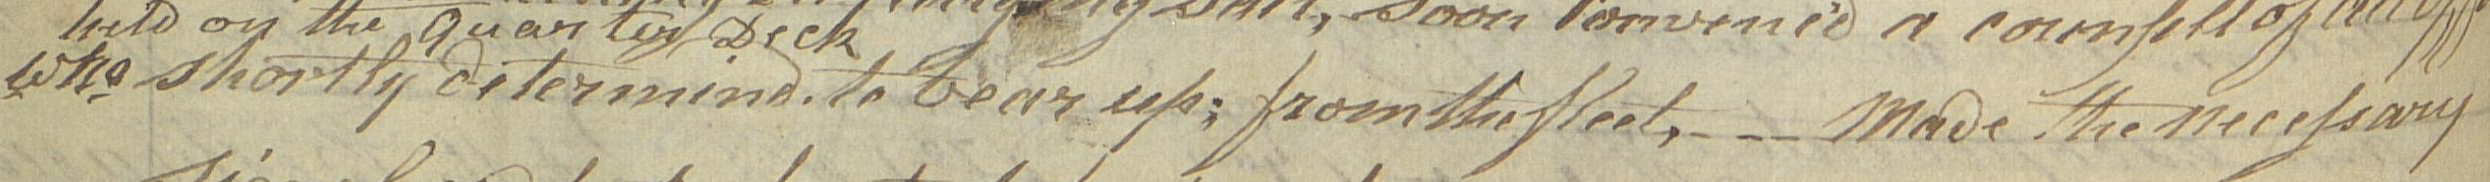who shortly determind to bear up; from the fleet, Made the necessary
